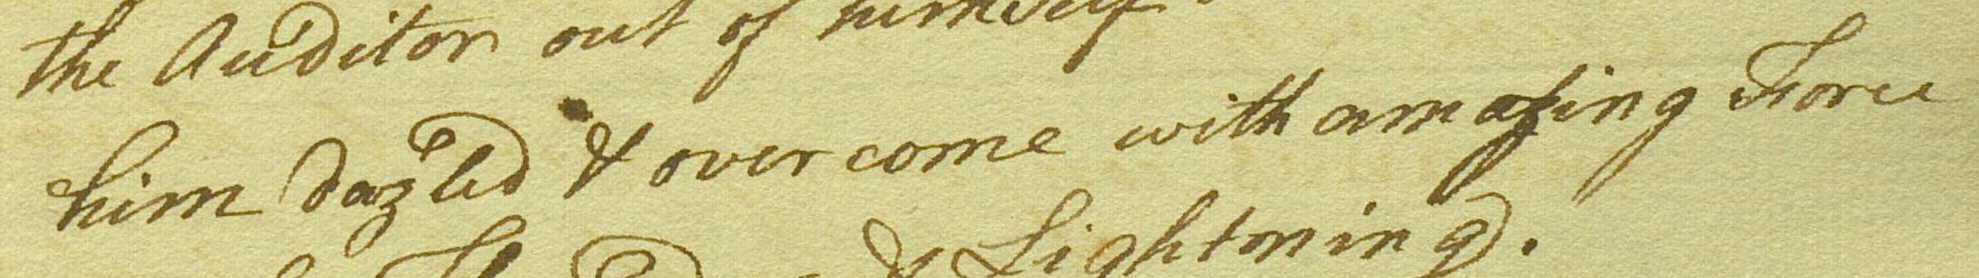him dazled & overcome with amassing Force
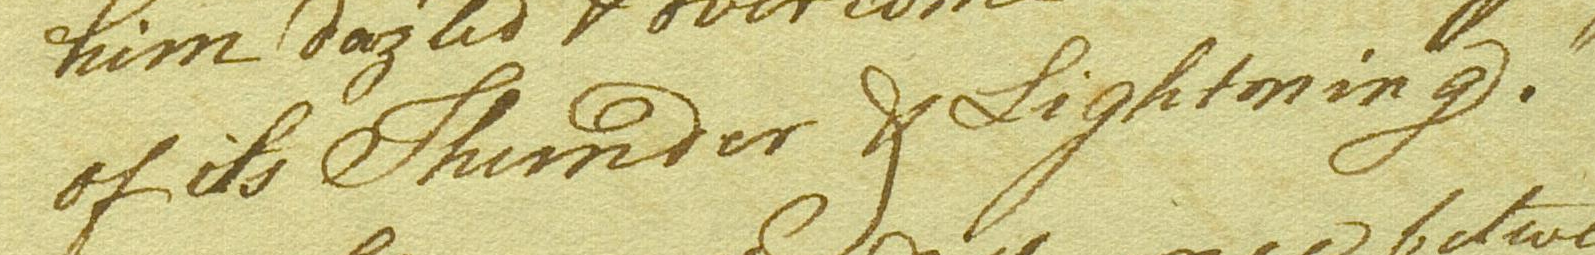of its Thunder & Lightning.
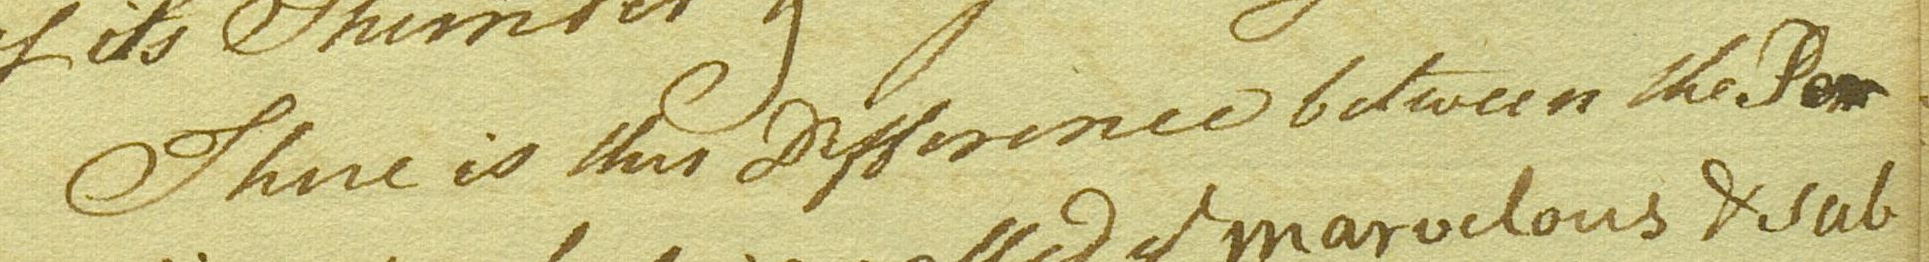There is this Difference between the Per
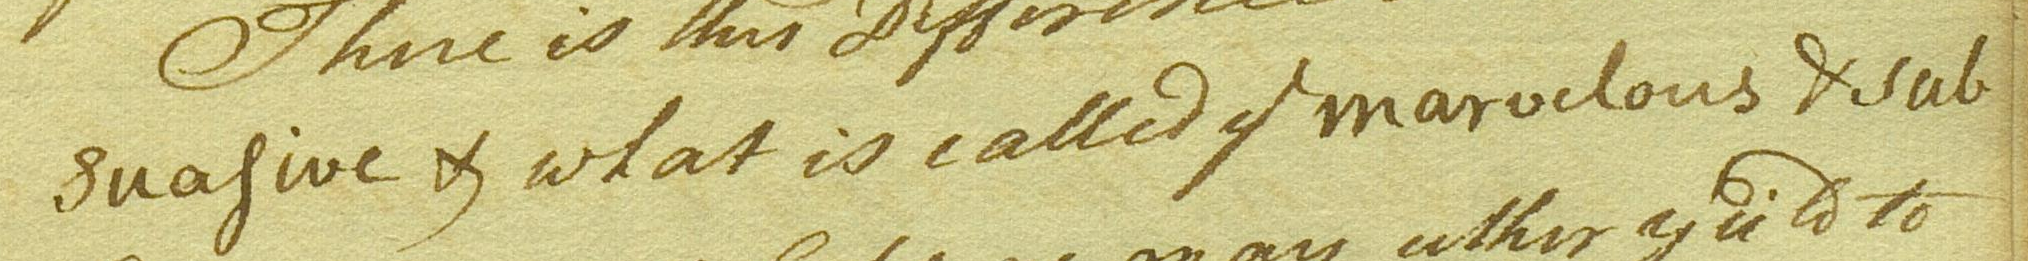suasive & what is called y^e marvelous & sub
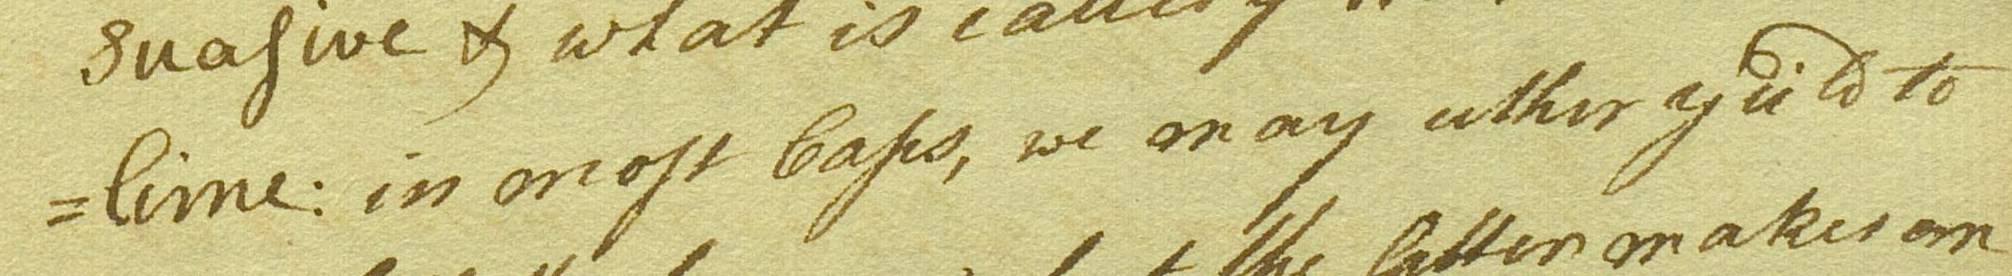-lime: in most Cases, we may either yield to
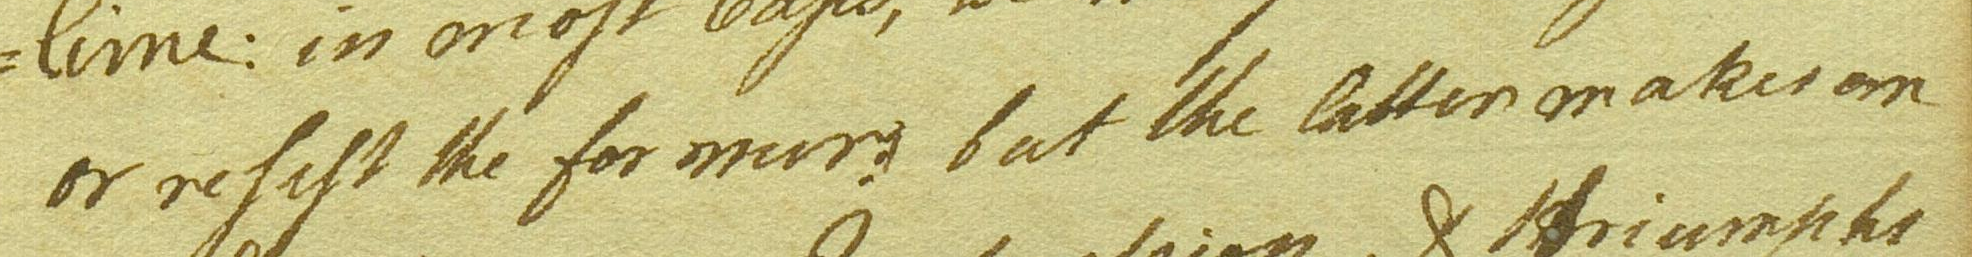or resist the former: but the latter makes an
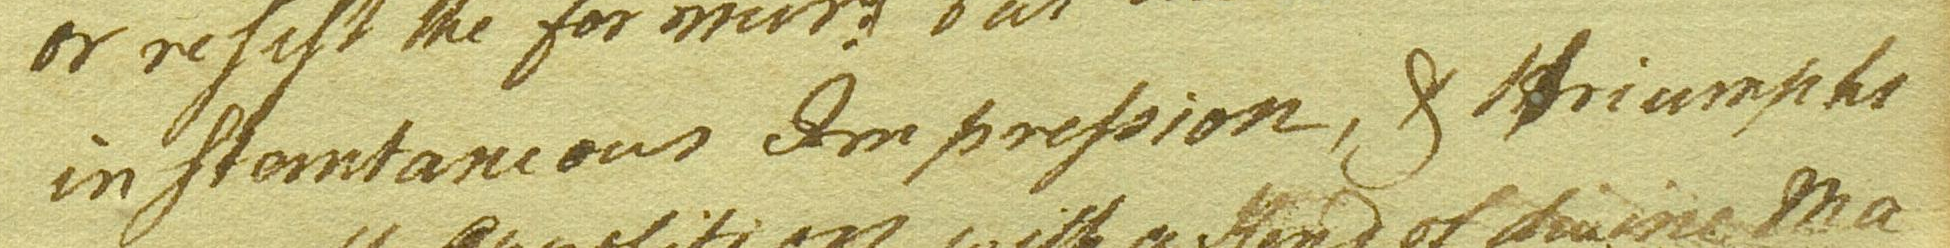instantaneous Impression, & triumphs
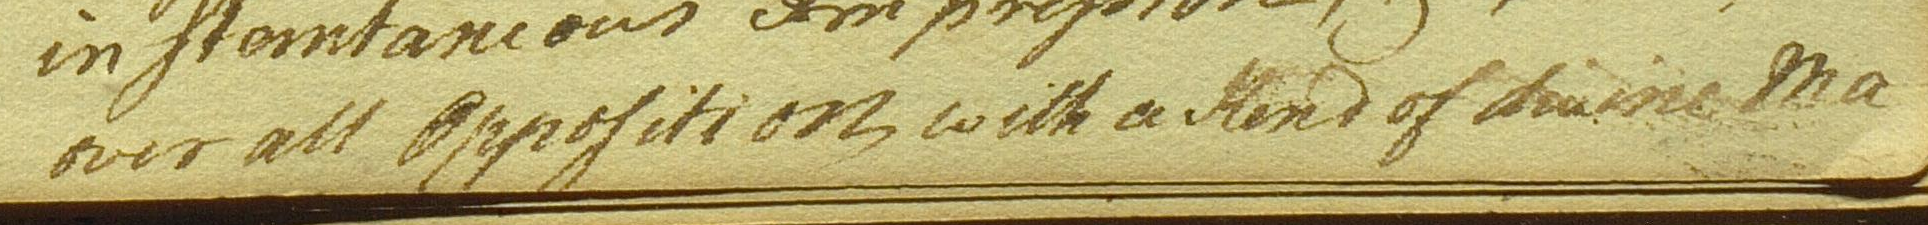over all Oppositions with a kind of divine Ma
